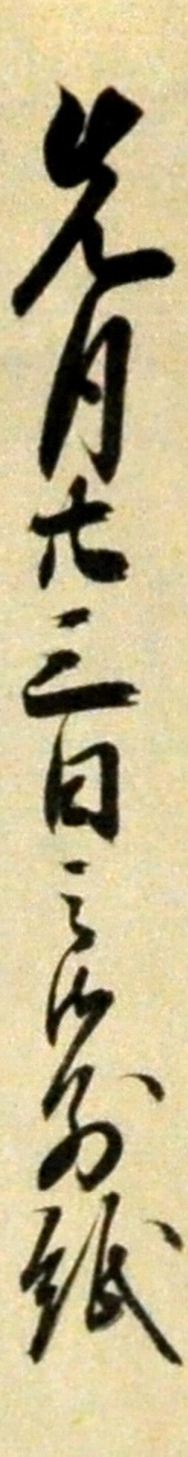先月廿三日之御別紙
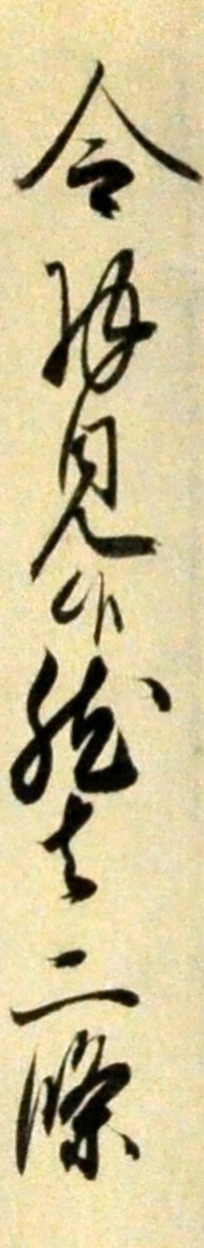令拝見候然は二条
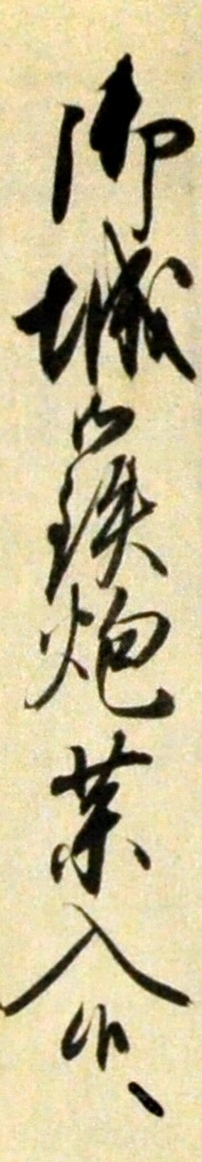御城御鉄炮薬入候
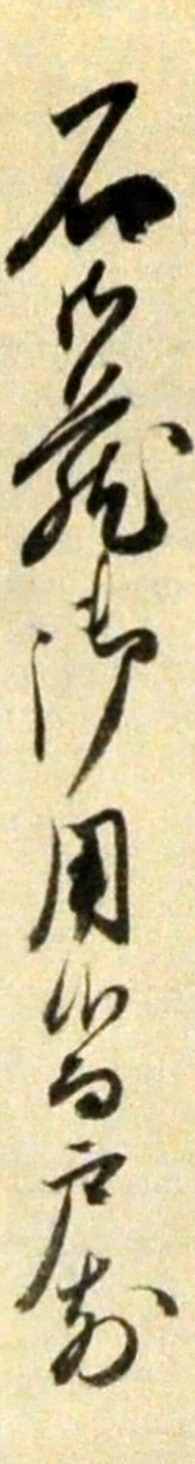石御蔵御用候而戸前
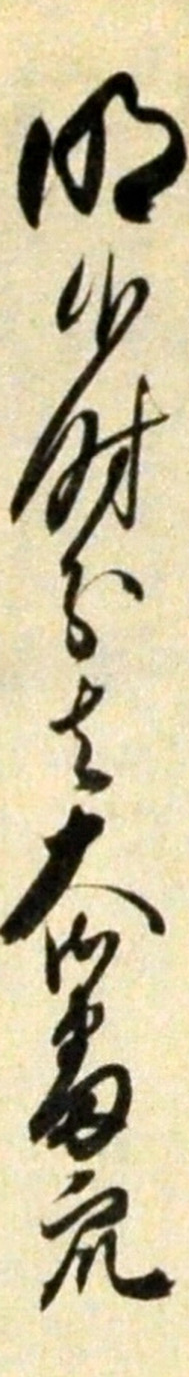明候時分は大御番衆
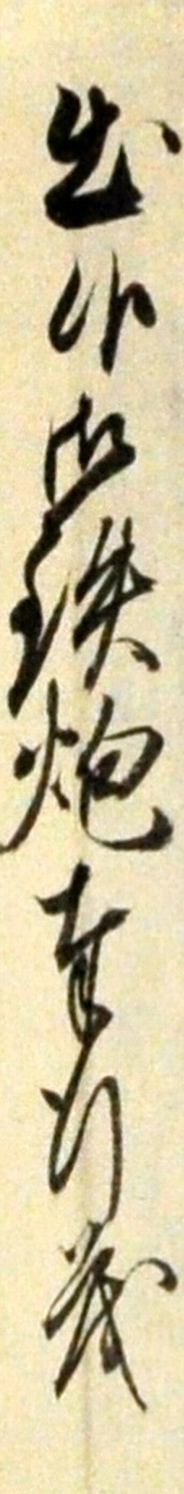出候御鉄炮奉行も
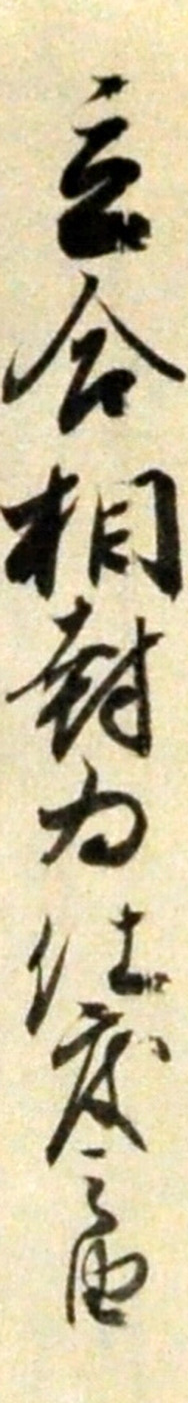立合相対為仕度之由
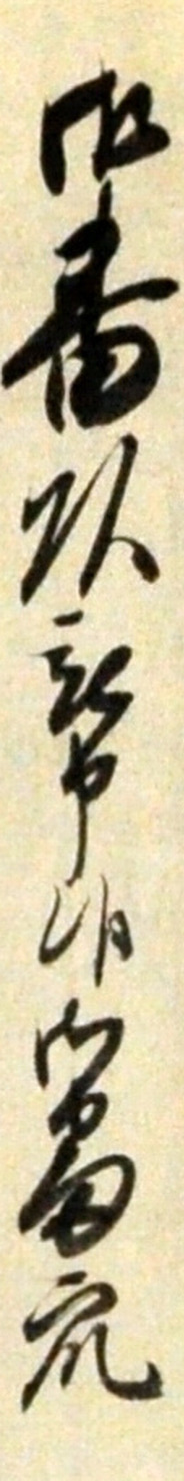御番以被申候御番衆
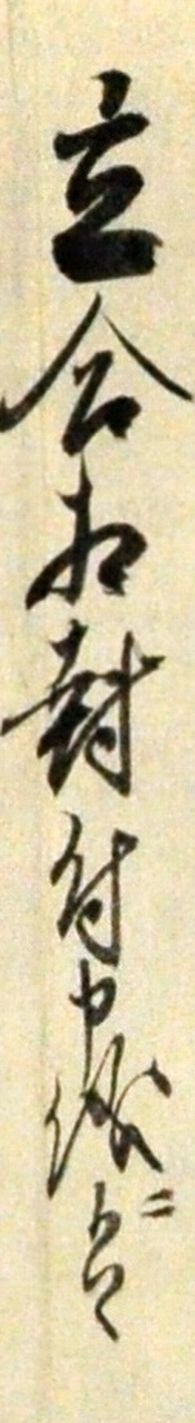立合相対付申儀に候はゝ
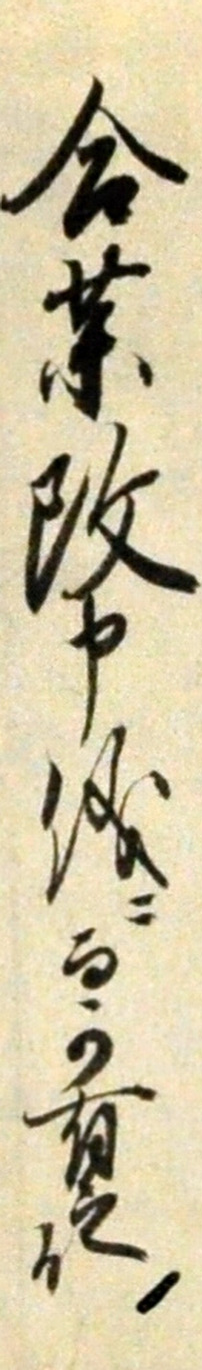合薬改申儀に而可有之候
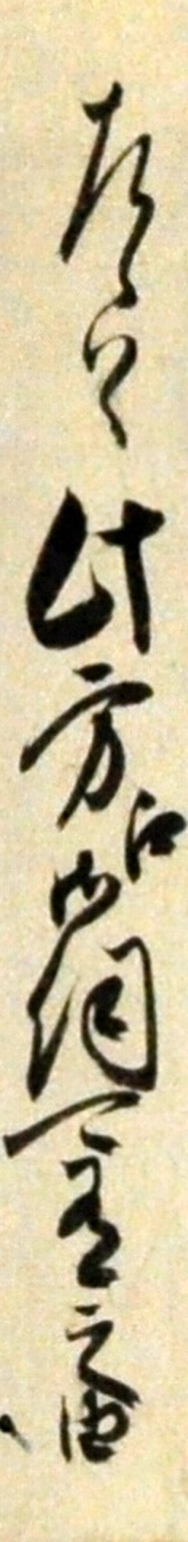左候はゝ此方え御伺可有之由
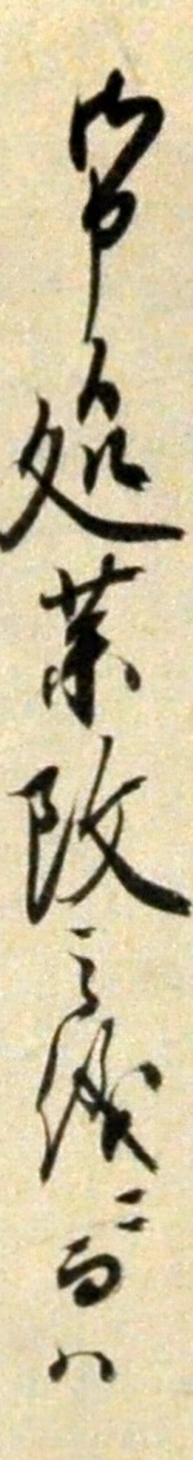御申候処薬改之儀に而は
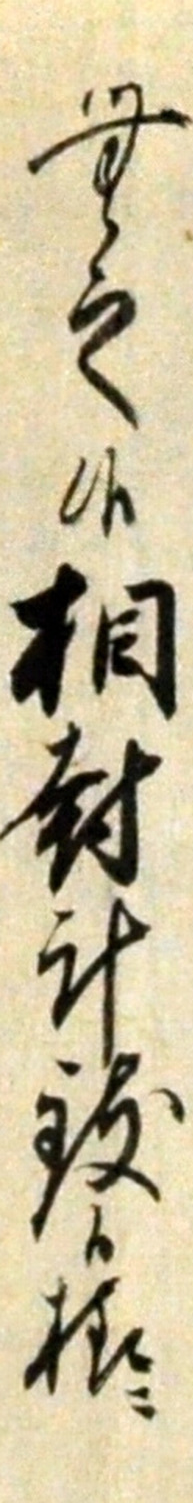無之候相対計致候様に
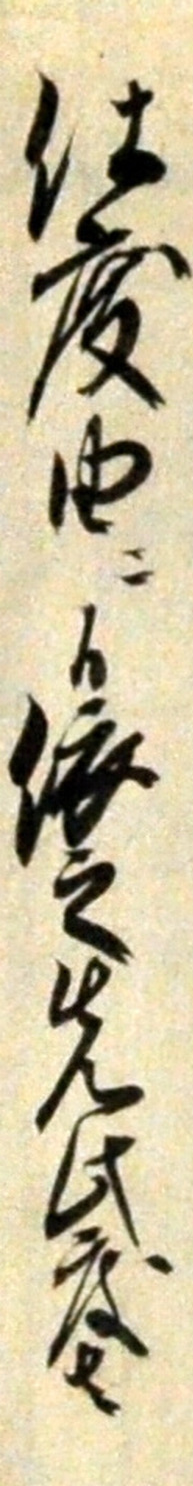仕度由に候依之先此度は
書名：書状
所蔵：伊那市立高遠町図書館・合同会社AMANE
